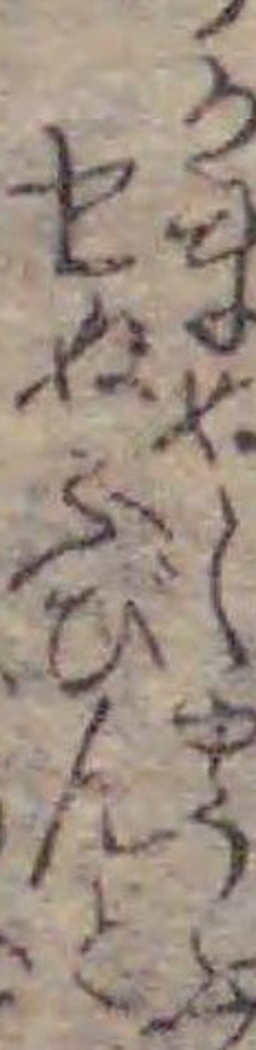せぬふびんと
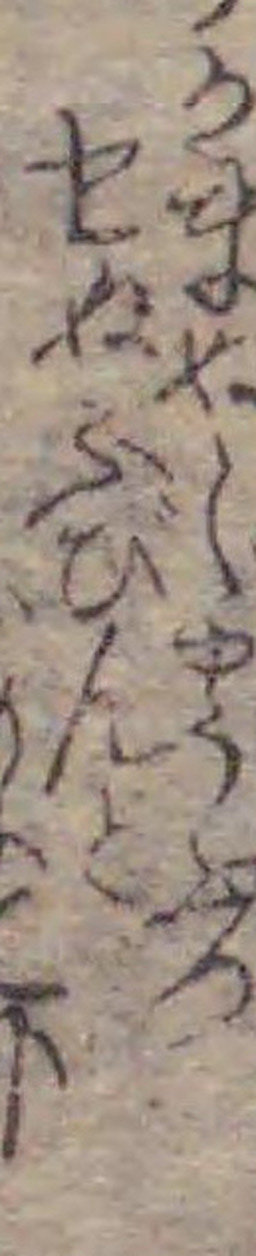せぬふびんと

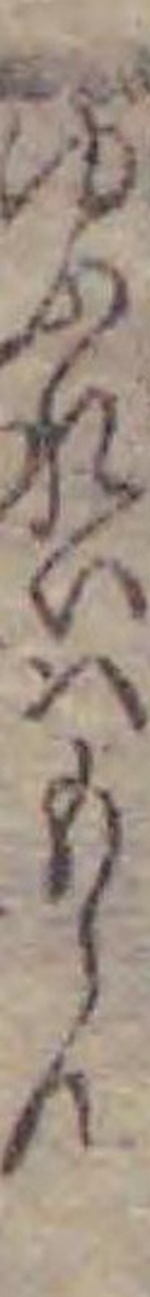ゆふれいはもゝん
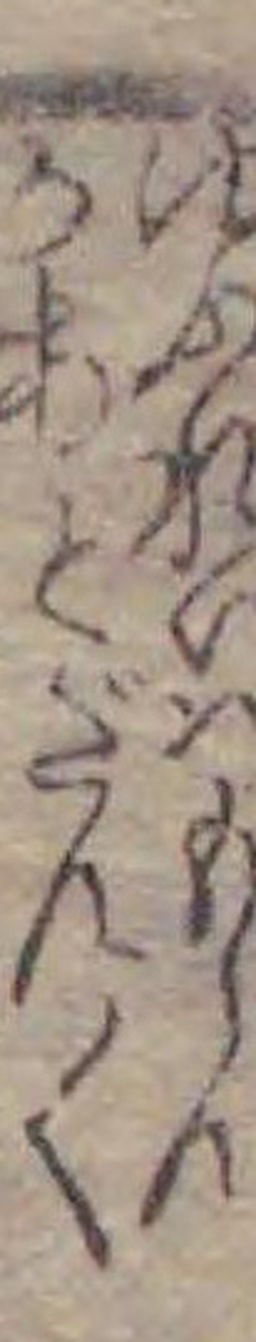かあとだん〳〵
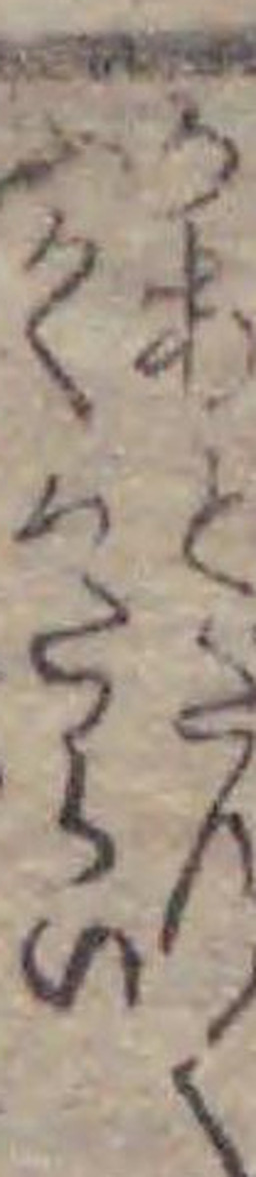ふかくかたらい
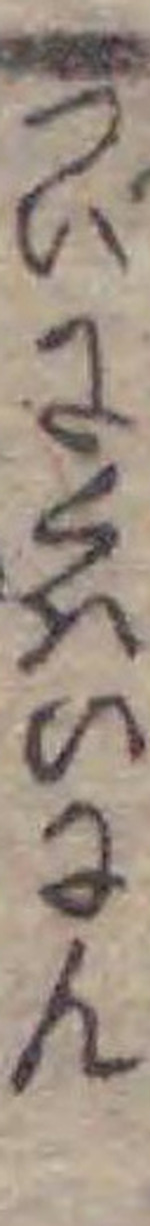ついにくわいにん
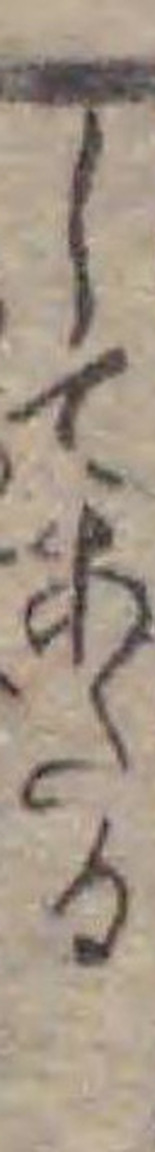してあたる
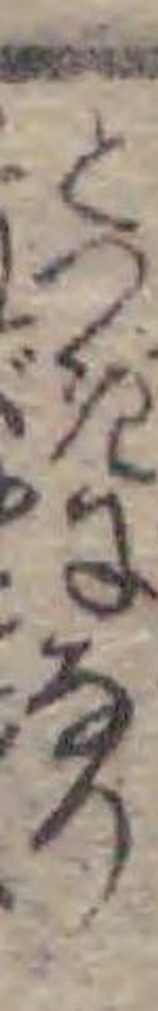とつきになり
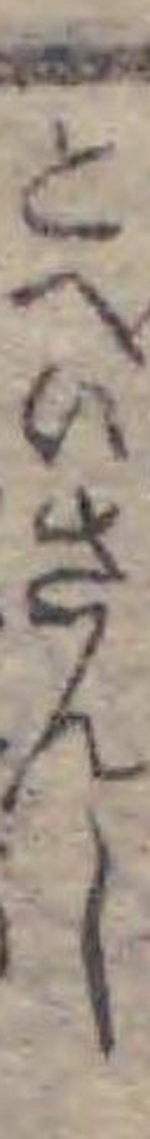とへいさんし
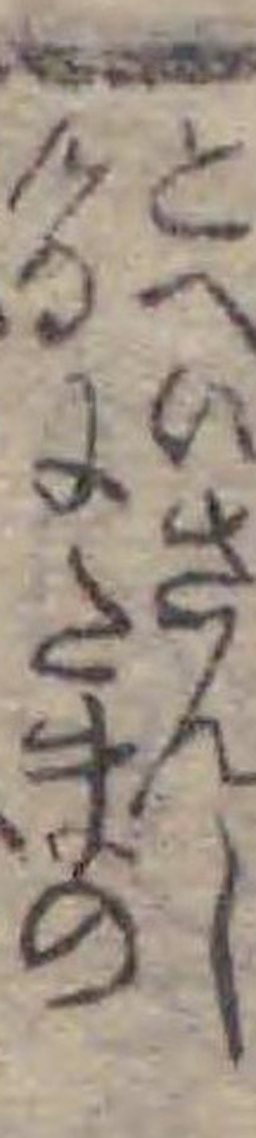けるにたまの
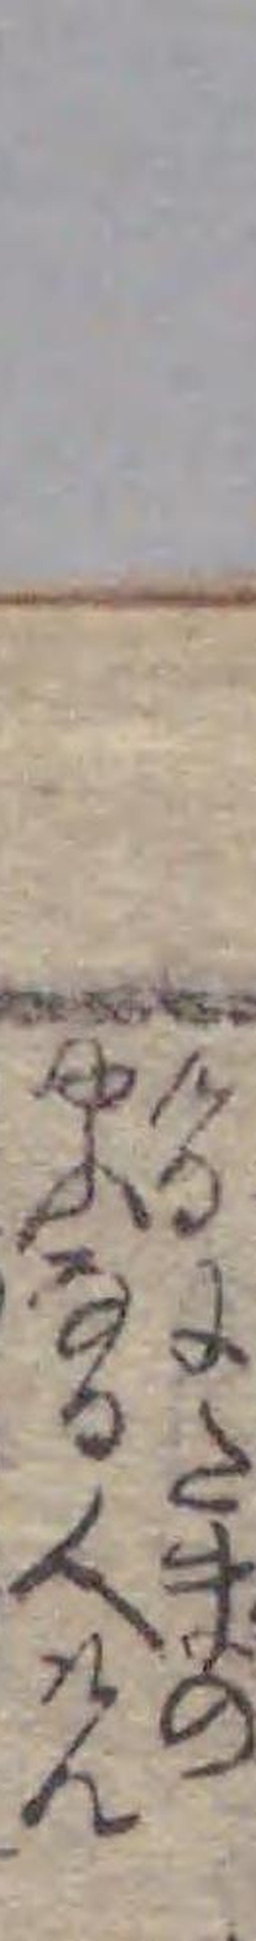やふなる人けん
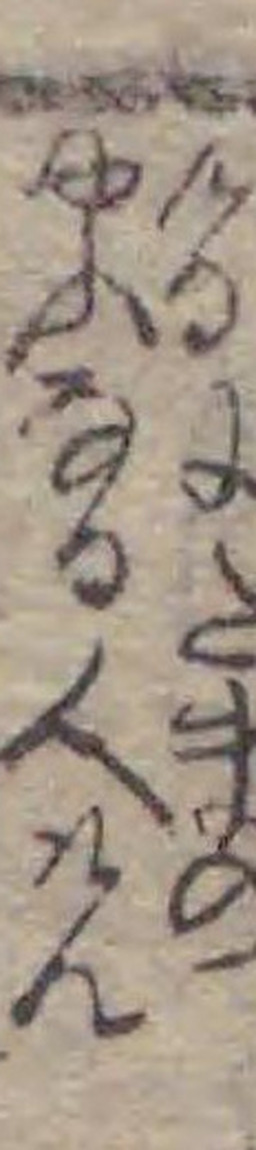やふなる人けん
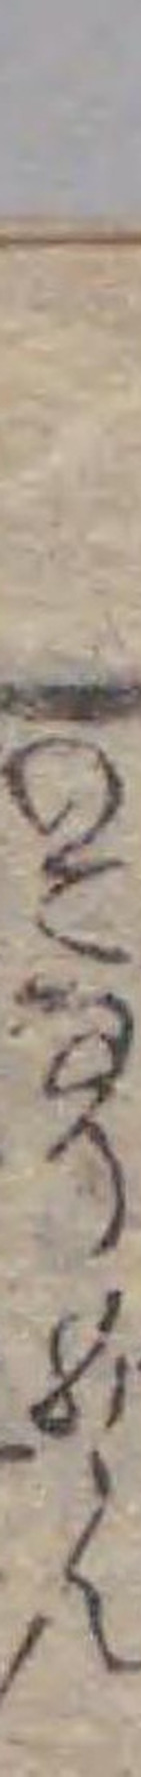のこなりもゝん
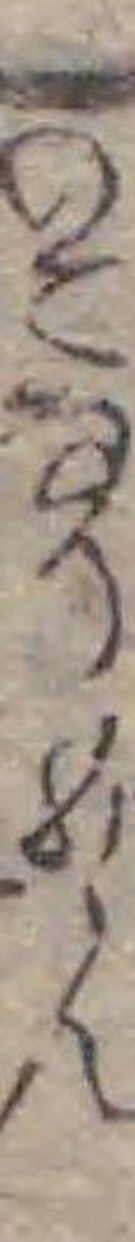のこなりもゝん
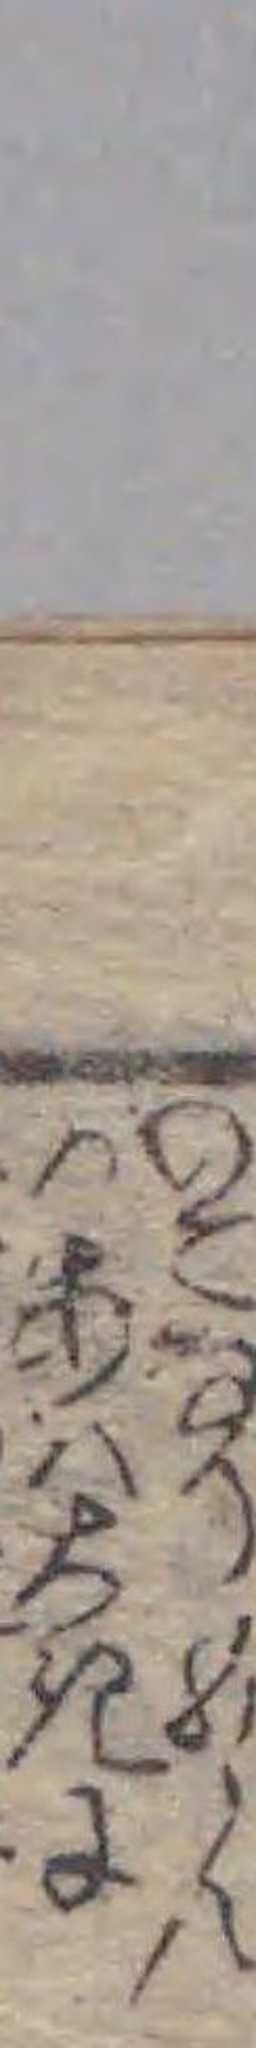かあは大きに
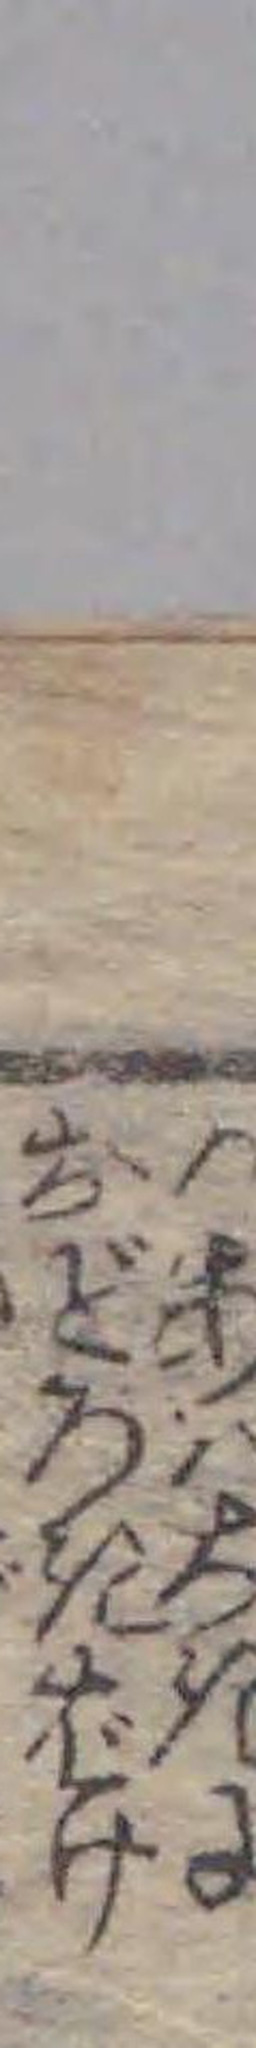おどろきばけ
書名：化物見越松 : 2巻
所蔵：国立国会図書館 National Diet Library, JAPAN
